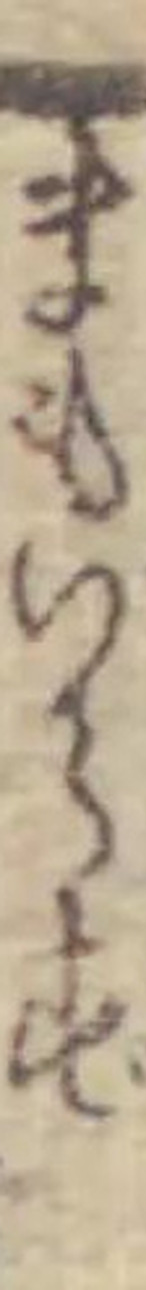まもいらず
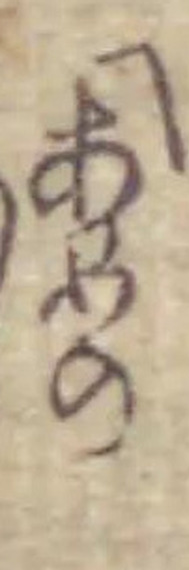〽あめの
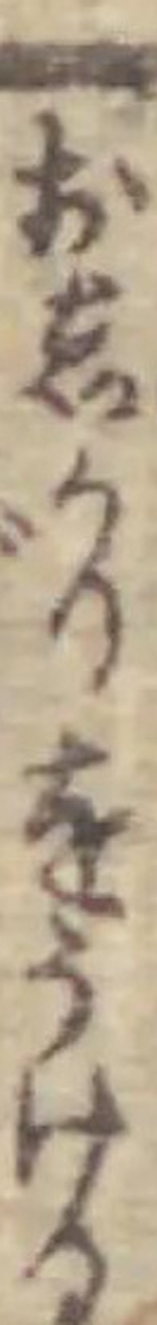おしかりをうける
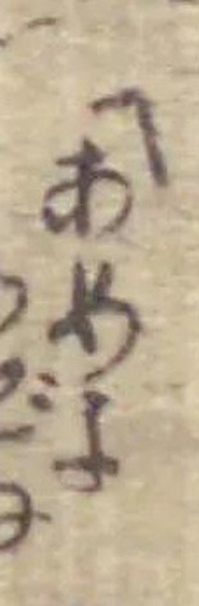〽あめよ
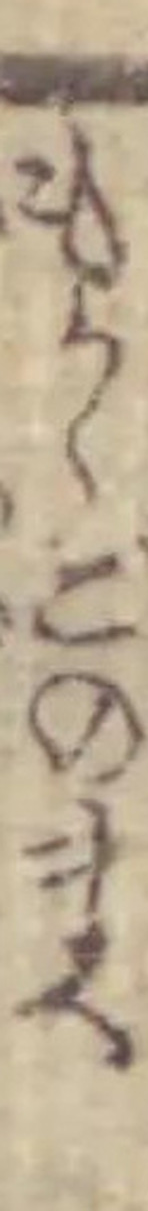もかくごのまへ
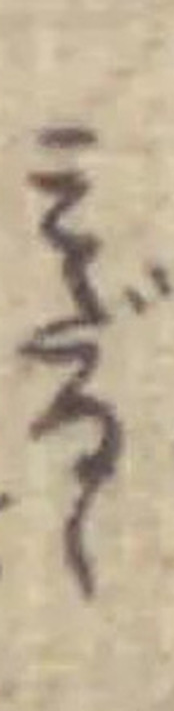みだるゝ
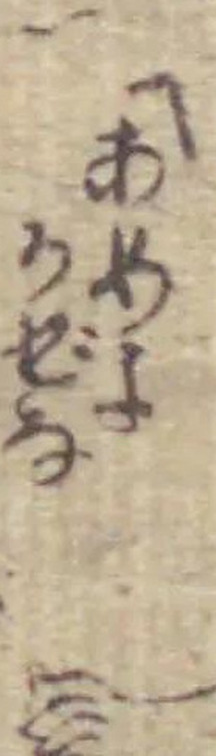〽あめよ
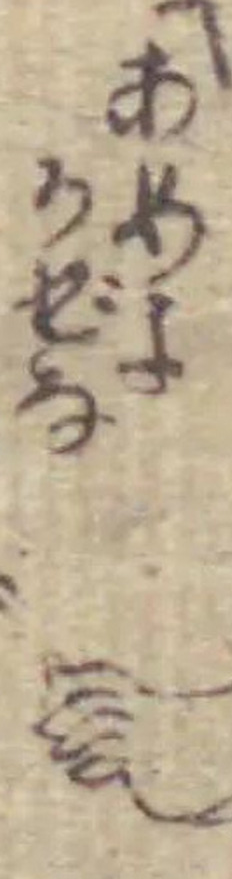あめかぜな
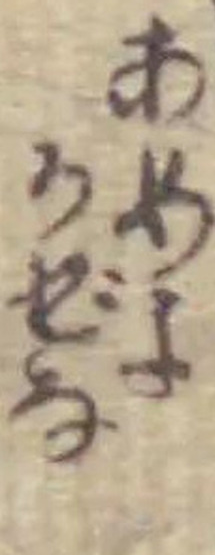かぜな
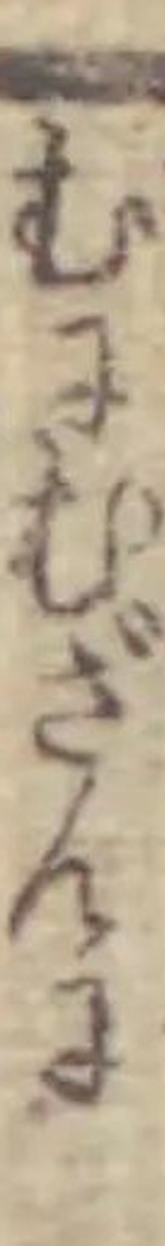むにむざんに
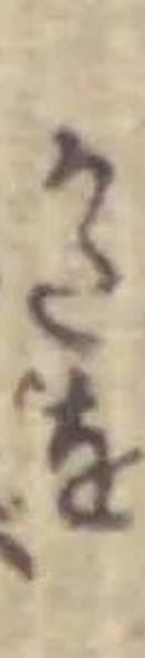かたを
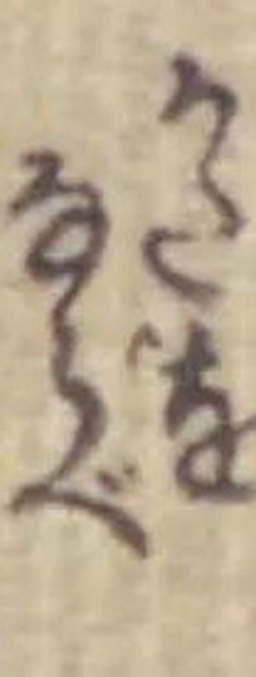ならべ
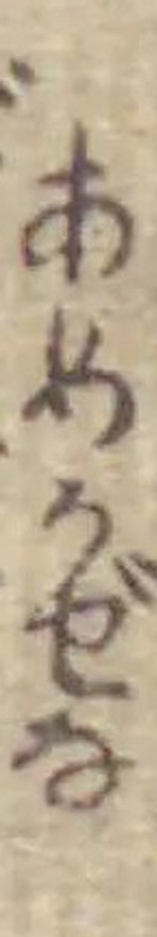あめかぜな
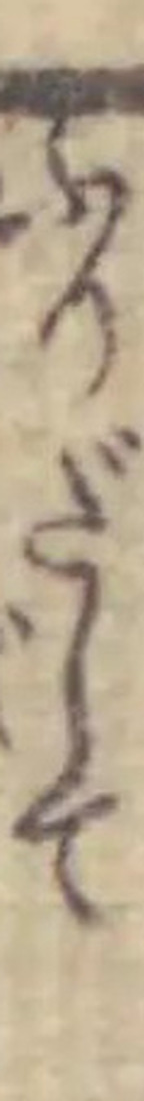ふりだして
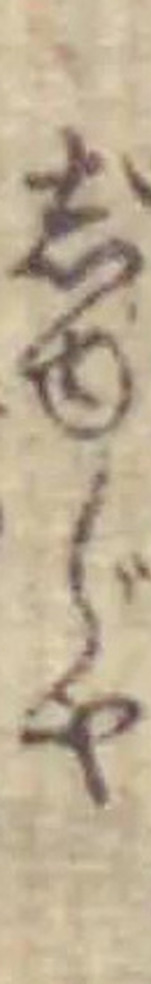にゆじや
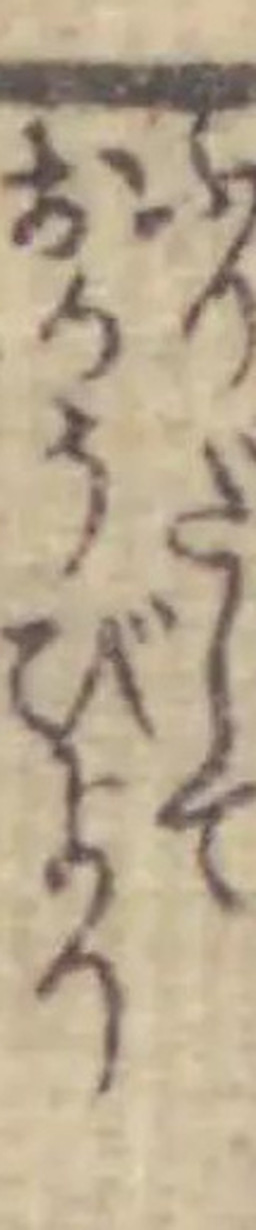おかうびより
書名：雨宮風宮出儘略縁記 3巻
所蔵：国立国会図書館 National Diet Library, JAPAN
